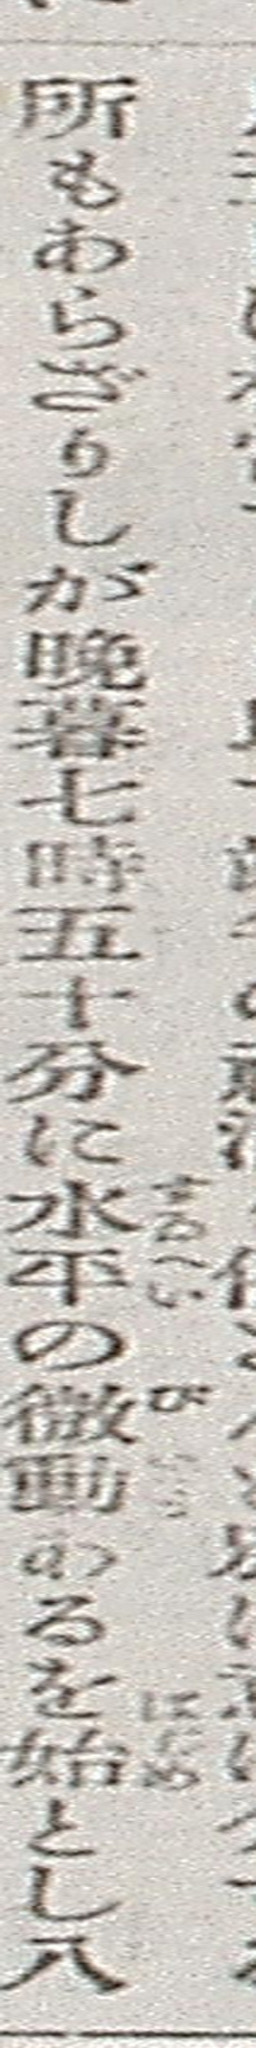所もあらざりしが晩暮七時五十分に水平の微動あるを始とし八
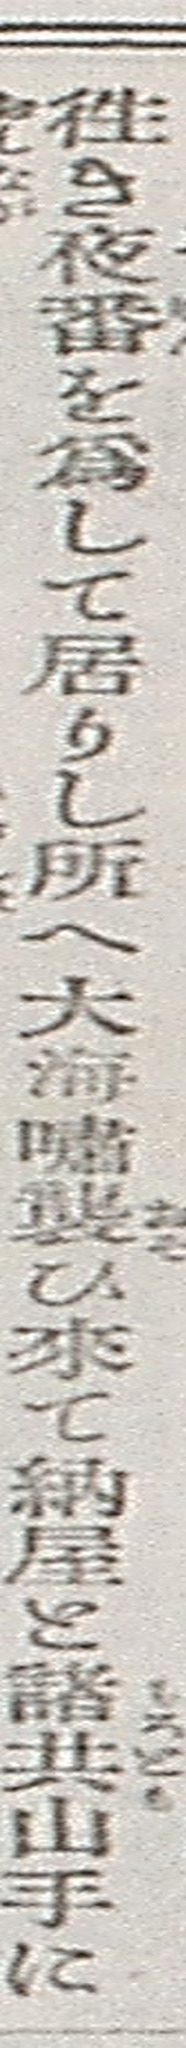往き夜番を為して居りし所へ大海嘯襲ひ来て納屋と諸共山手に
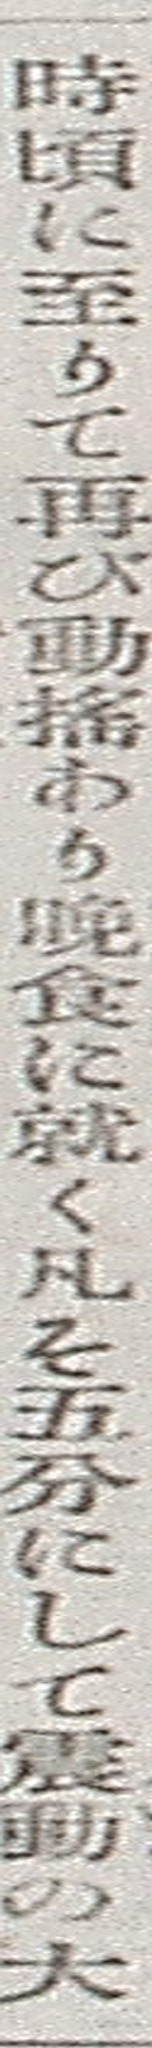時頃に至りて再び動揺あり晩食に就く凡そ五分にして震動の大
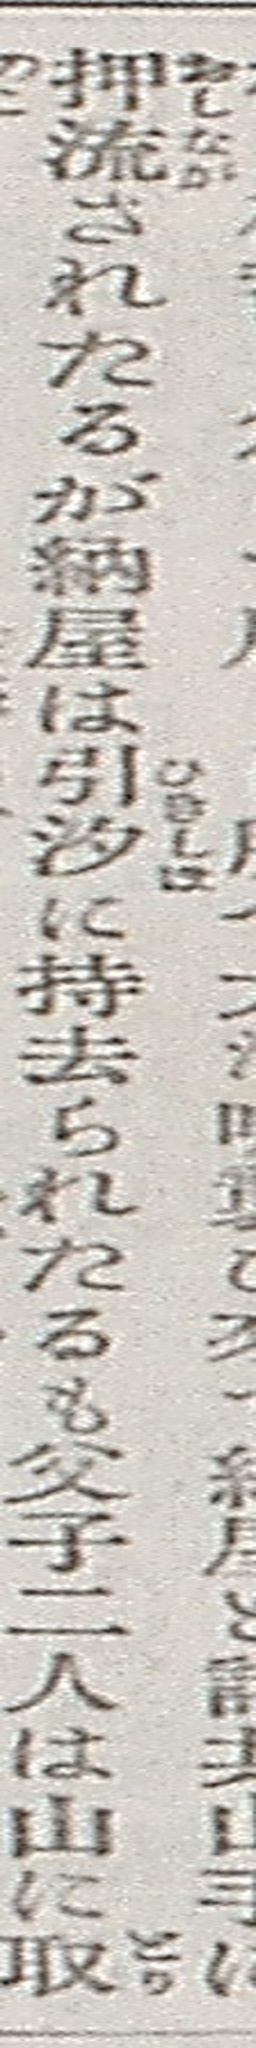押流されたるが納屋は引汐に持去られたるも父子二人は山に取
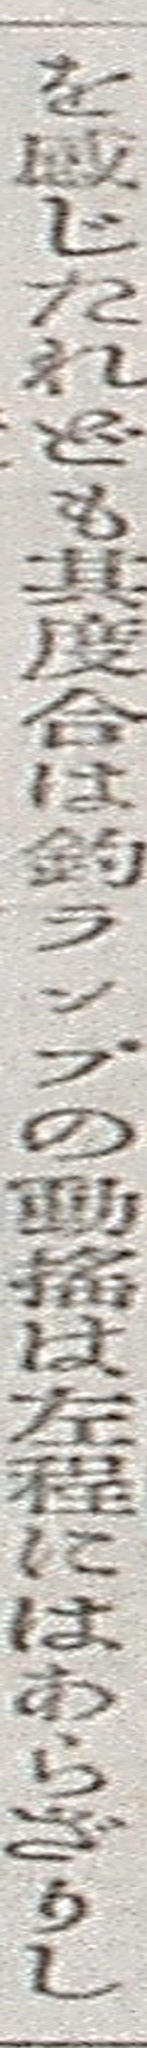を感じたれども其度合は釣ランプの動揺は左程にはあらざりし
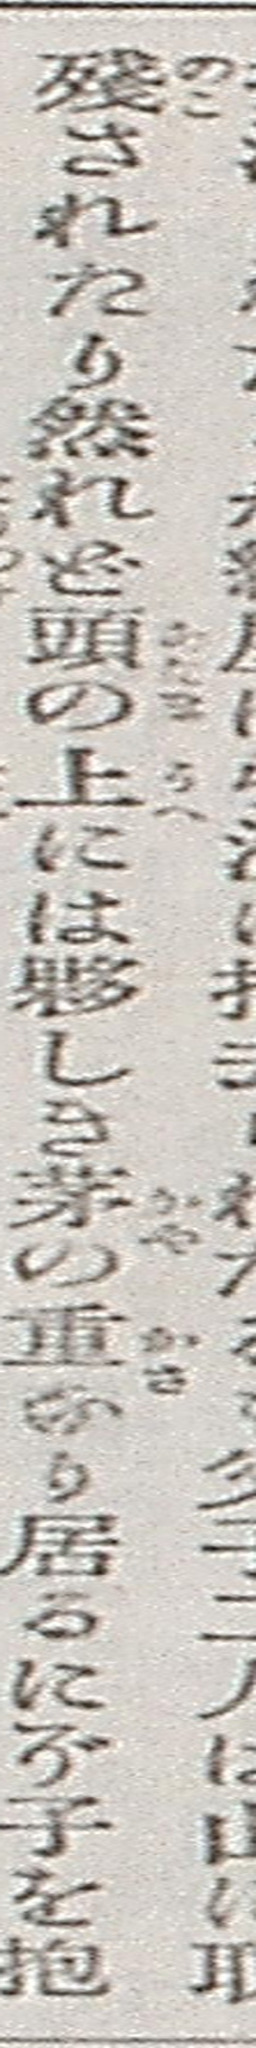残されたり然れど頭の上には夥しき茅の重なり居るにぞ子を抱
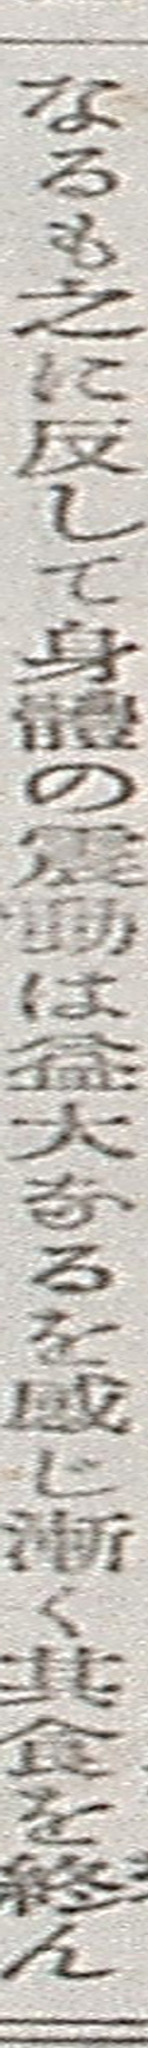なるも之に反して身体の震動は益大なるを感じ漸く其食を終ん
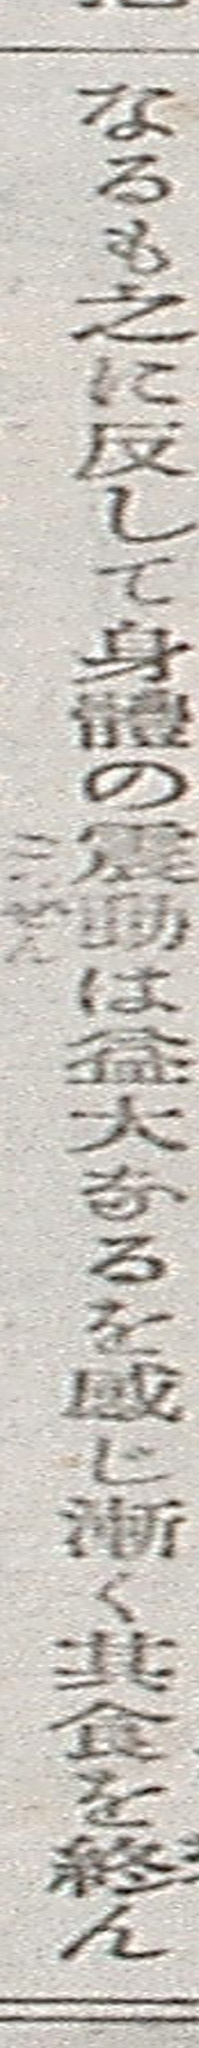なるも之に反して身体の震動は益大なるを感じ漸く其食を終ん
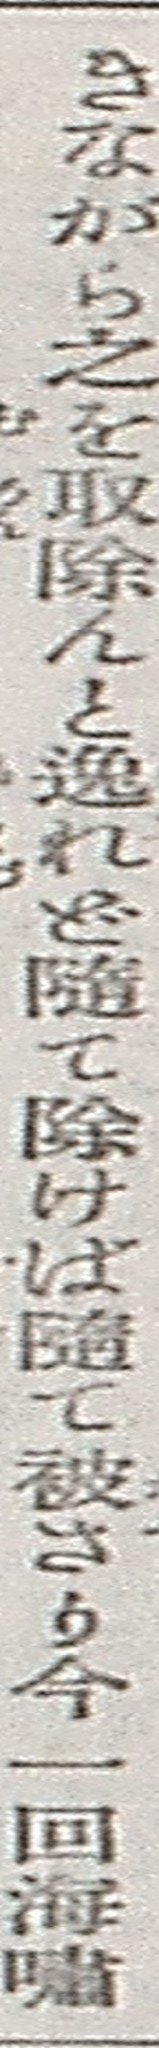きながら之を取除んと逸れど隨て除けば隨て被さり今一回海嘯
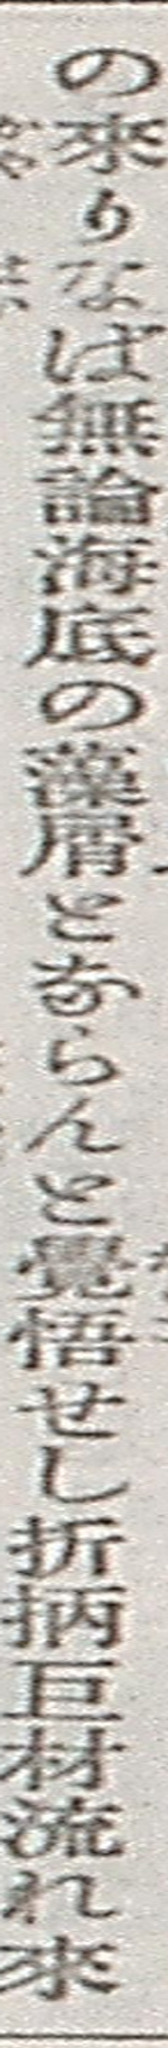の来りなば無論海底の藻屑とならんと覚悟せし折柄巨材流れ来
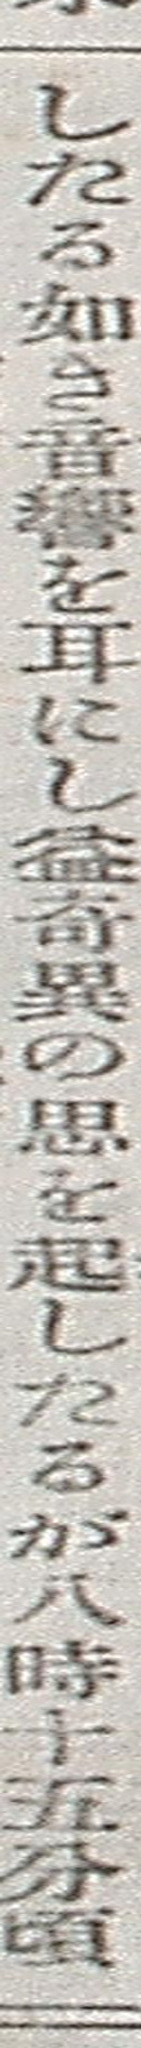したる如き音響を耳にし益奇異の思を起したるが八時十五分頃
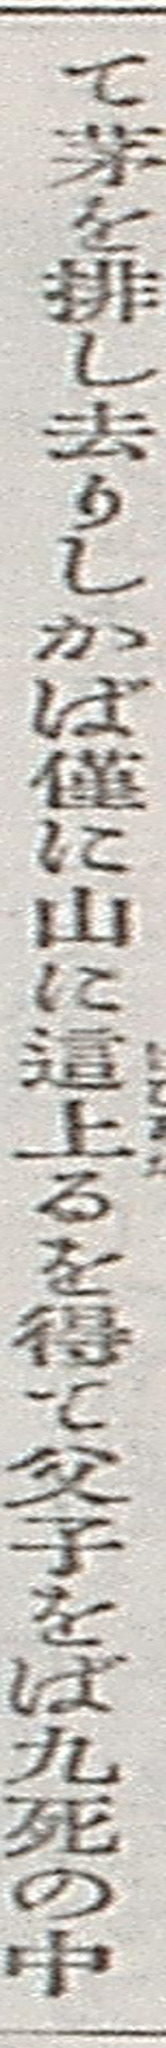て茅を排し去りしかば僅に山に這上るを得て父子をば九死の中
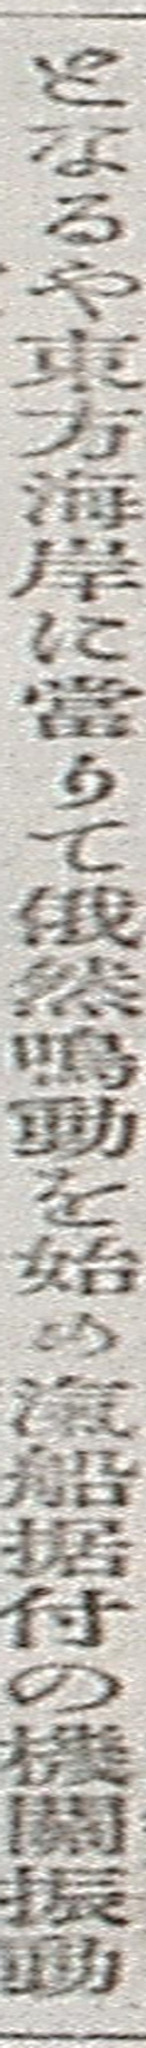となるや東方海岸に当りて俄然鳴動を始め汽船据付の機関振動
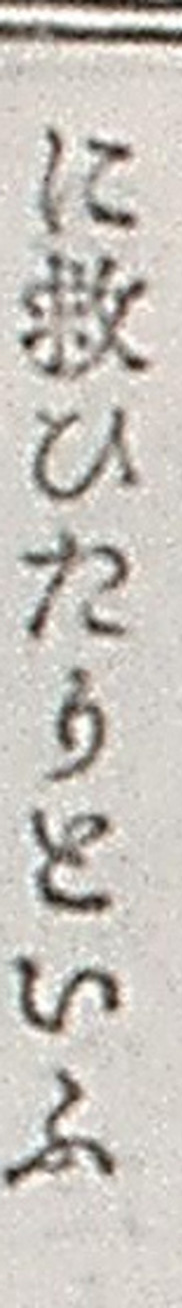に救ひたりといふ
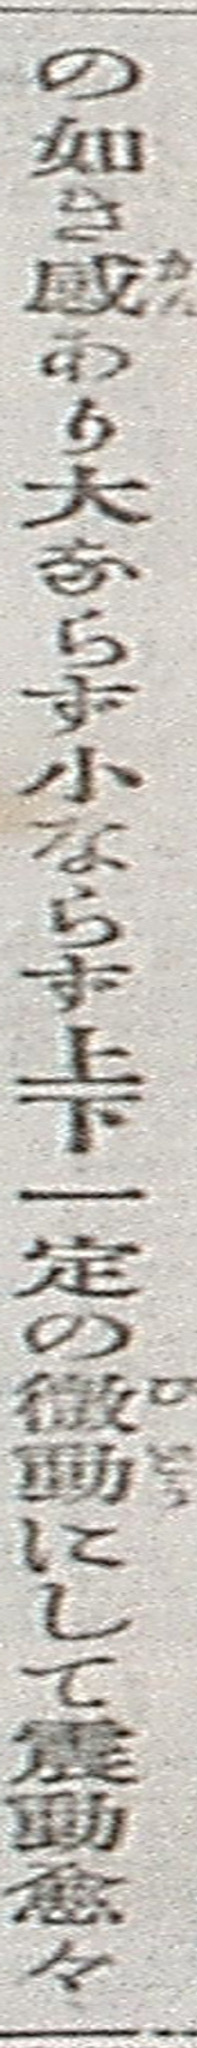の如き感あり大ならず小ならず上下一定の微動にして震動愈々

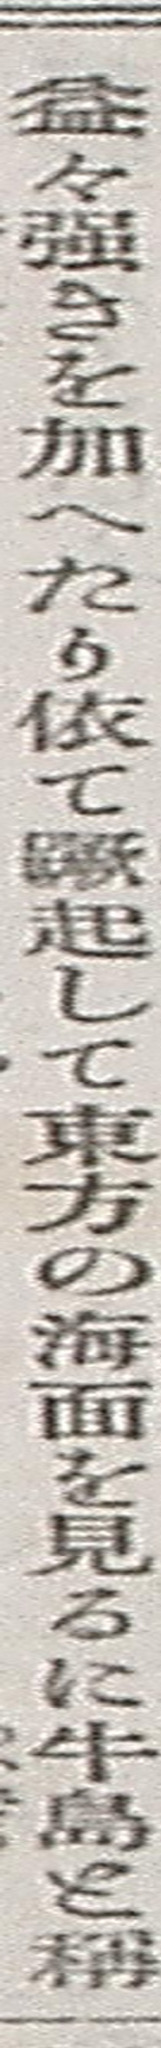益々強きを加へたり依て蹶起して東方の海面を見るに牛島と称
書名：風俗畫報臨時増刊第百二十號　大海嘯被害録（下）
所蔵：東京大学地震研究所図書室 Earthquake Research Institute Library, The University of Tokyo, JAPAN
